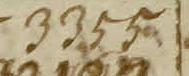3355
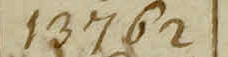13762
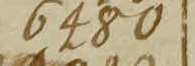6480
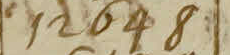12648
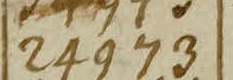24973
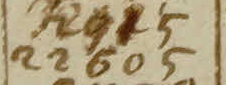22605
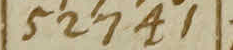52741
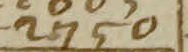2750
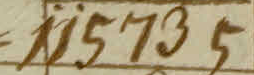115735
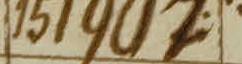151907
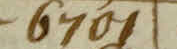6701
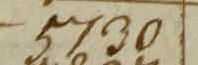5730
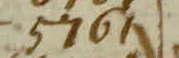5761
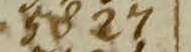5827
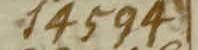14594
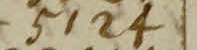5124
